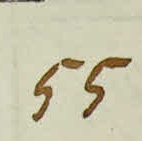55
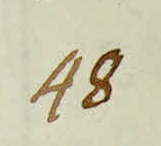48
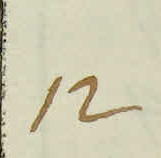12
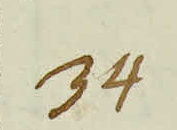34
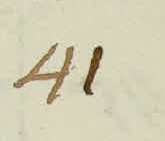41
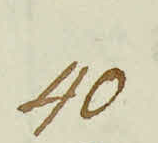40
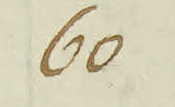60
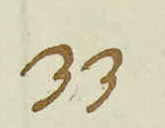33
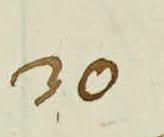30
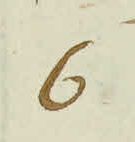6
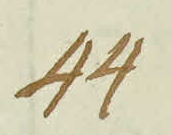44
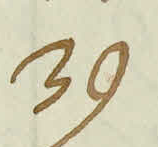39
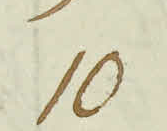10
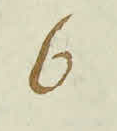6
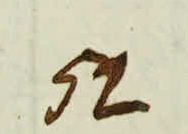52
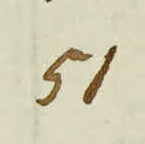51
